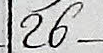26
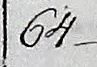64
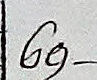69
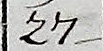27
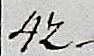42
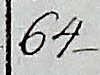64
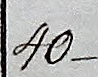40
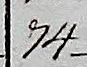74
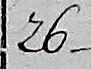26
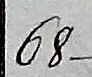68
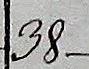38
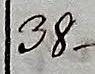38
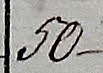50
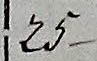25
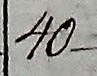40
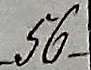56
